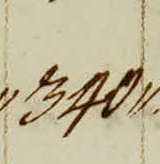340
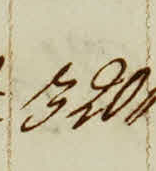320
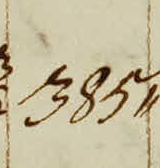385
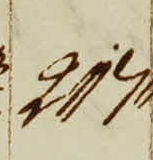217
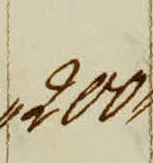200
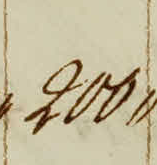200
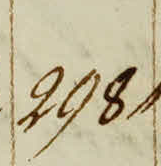298
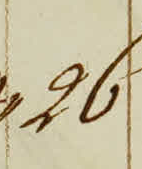26
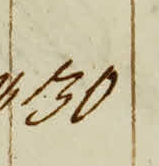30
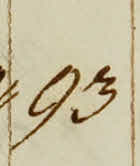93
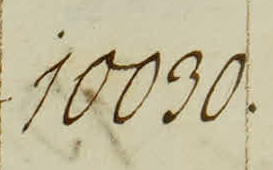10030
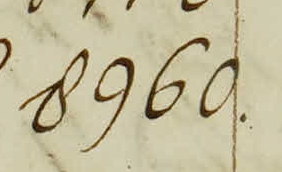8960.
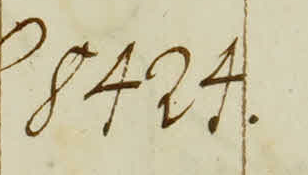8424.
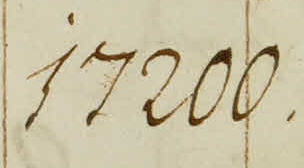17200
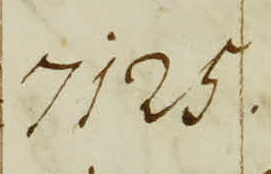7125
